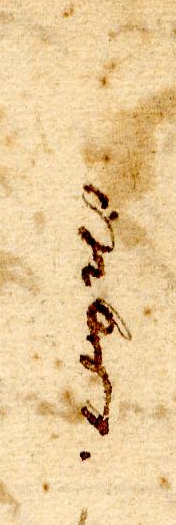oners.
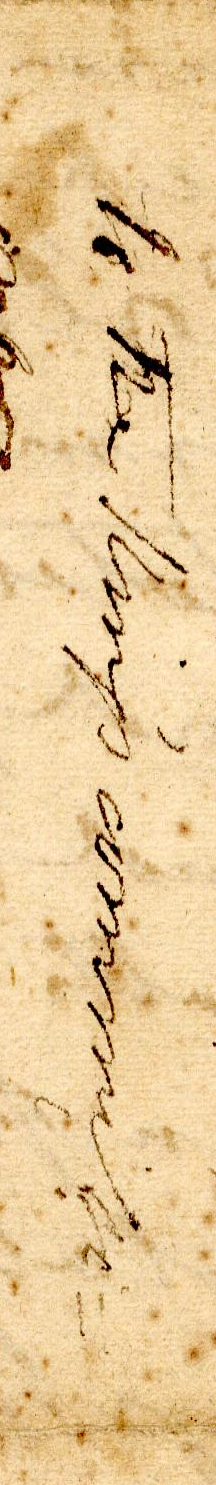to the King's commissi-
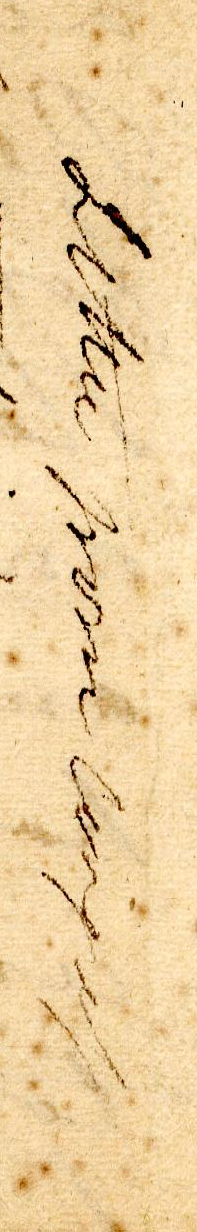Letter from Congress
